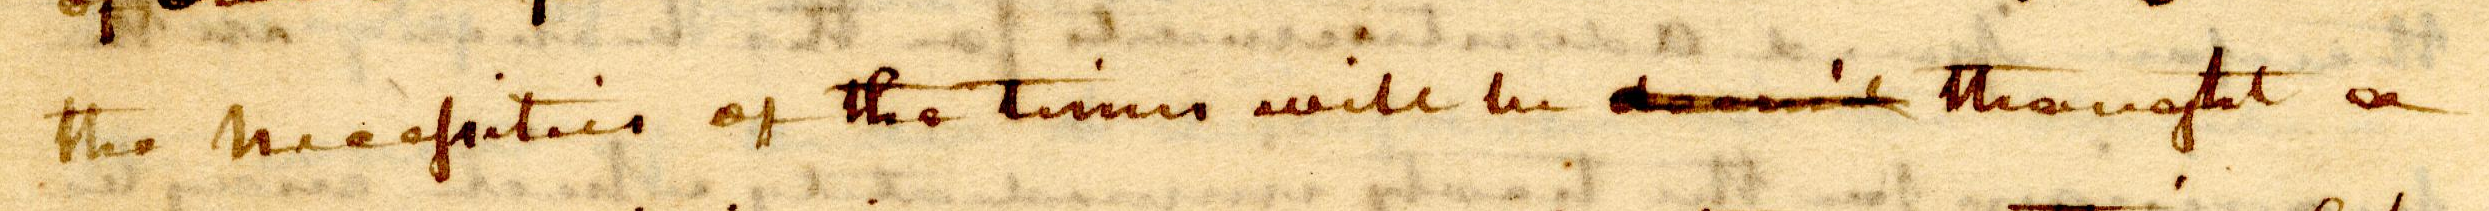the Necessities of the times will be [deem'd] thought a
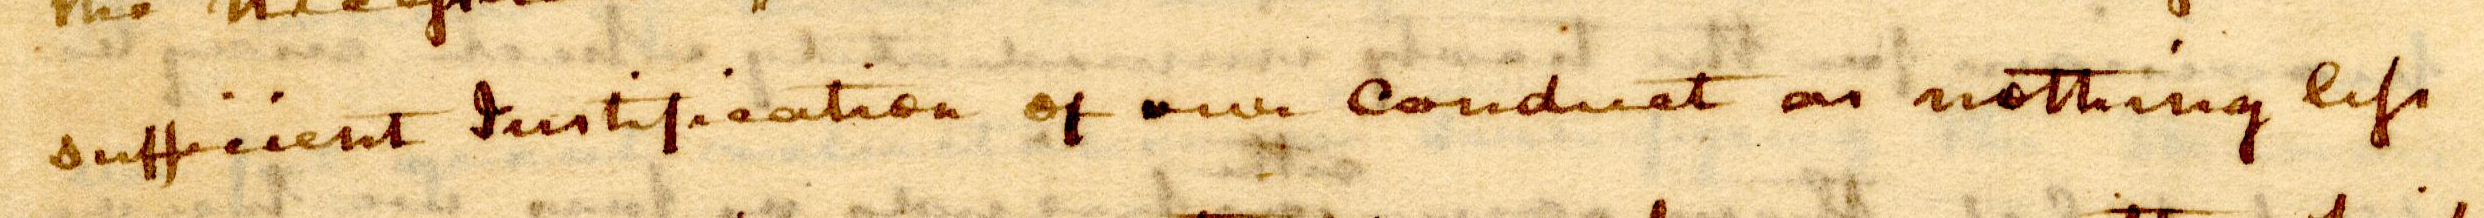sufficient Justification of our Conduct as nothing less
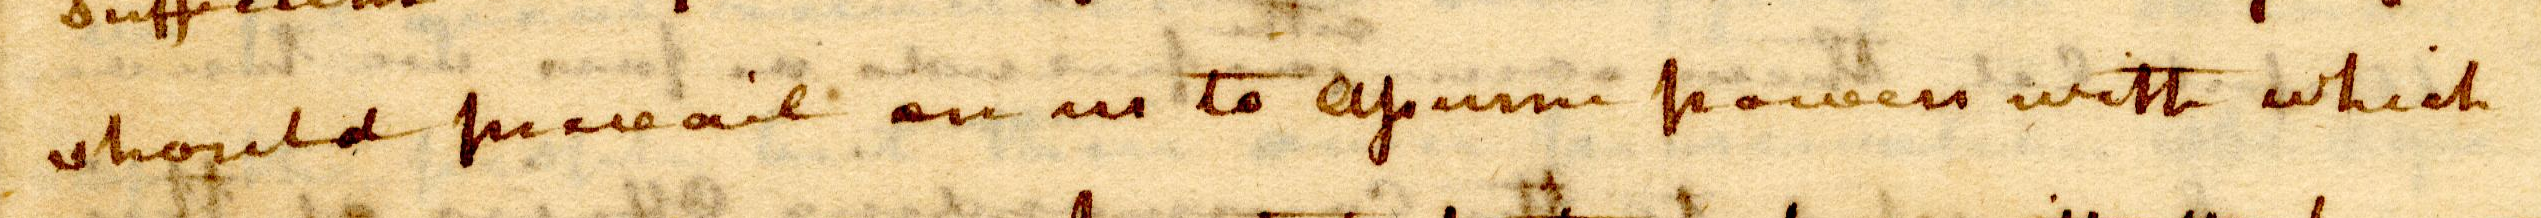should prevail on us to Assume powers with which
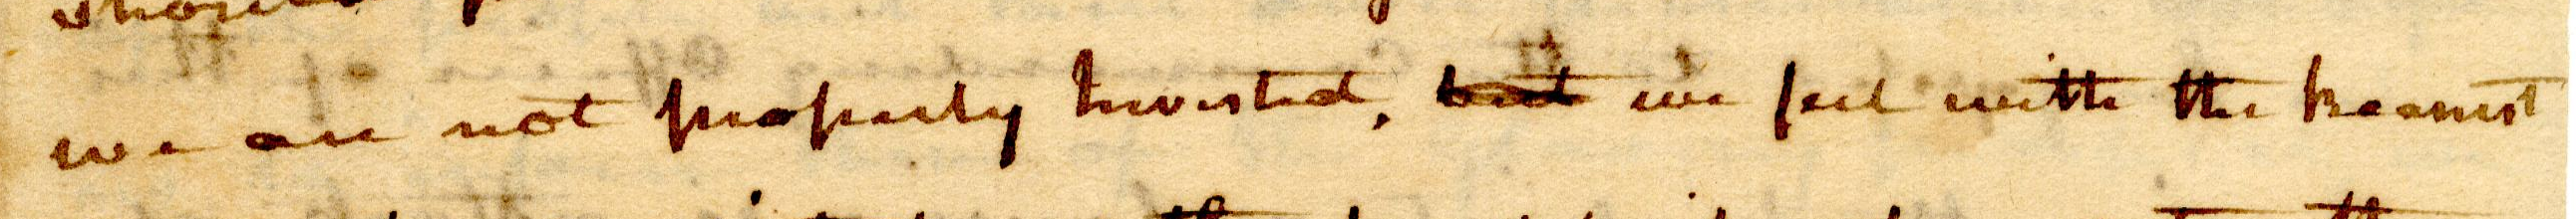we are not properly Invested, [but] we feel with the keenest
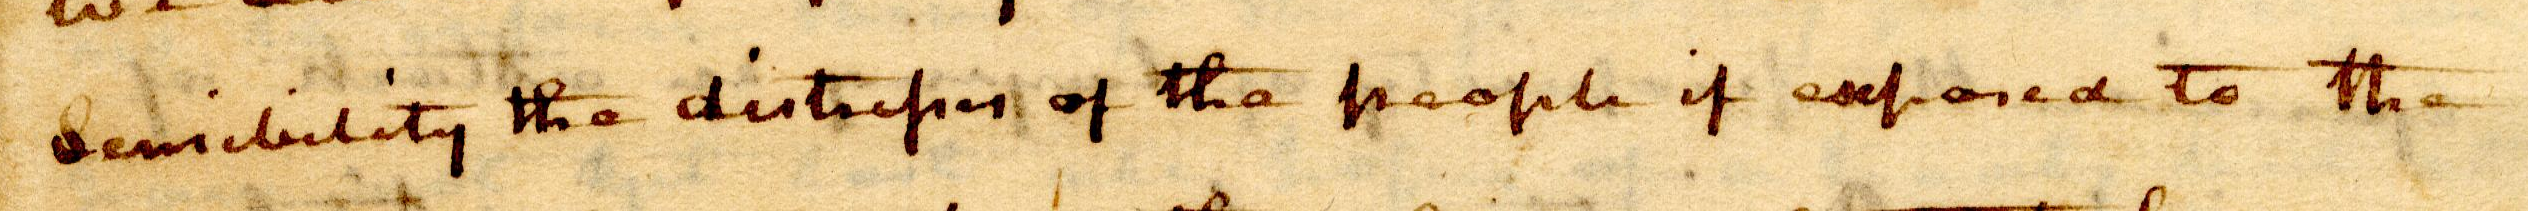Sensibility the distresses of the people if exposed to the
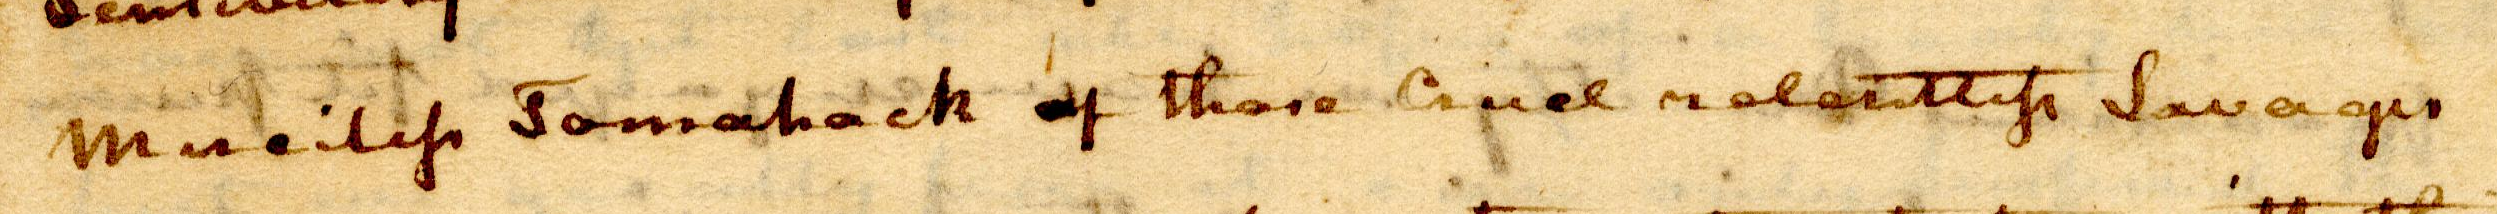Merciless Tomahack of those Cruel relentless Savages
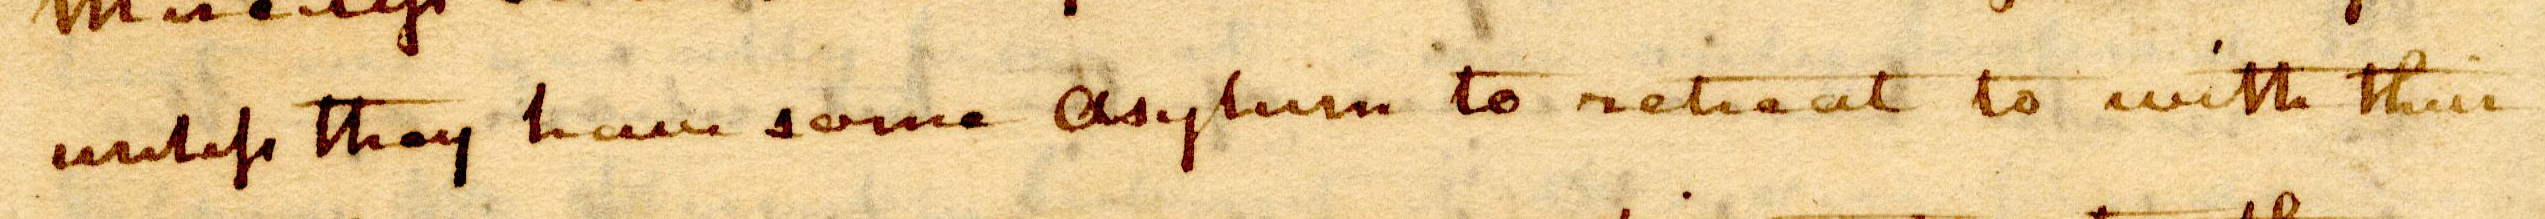unless they have some Asylum to retreat to with their
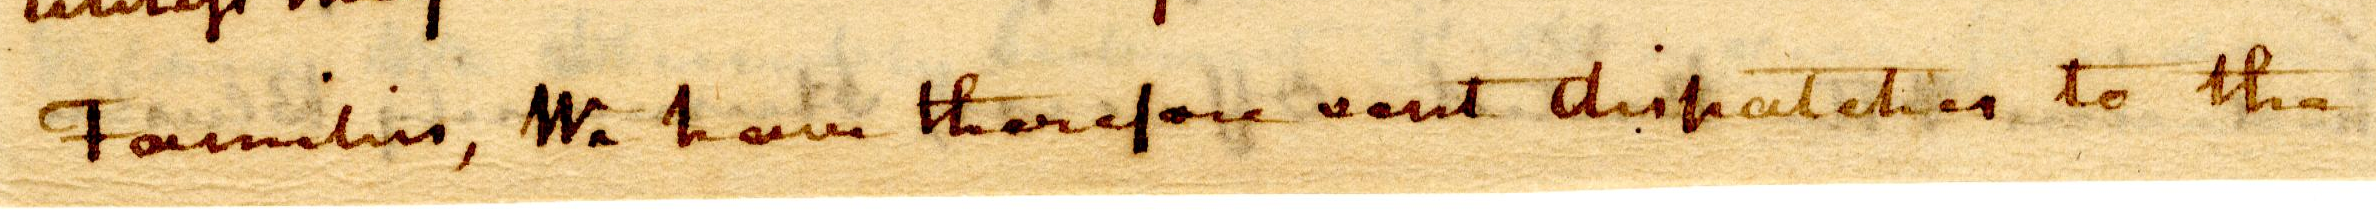Families, We have therefore sent dispatches to the
